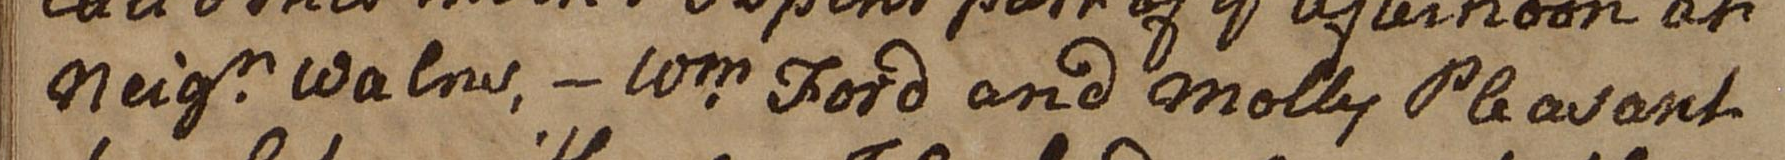Neig^r. Walns,- W^m. Ford and Molly Pleasant
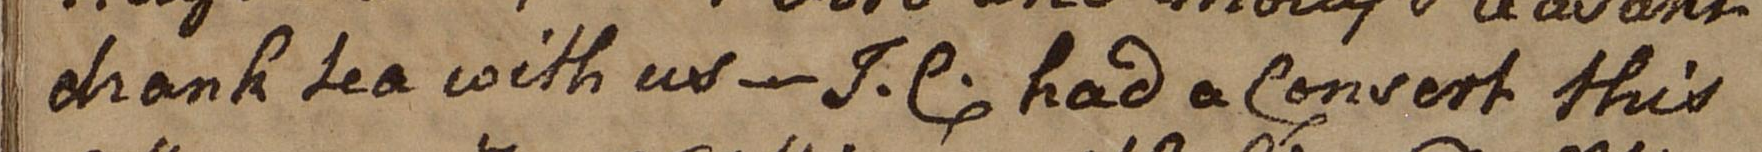drank tea with us- J.C. had a Consort this
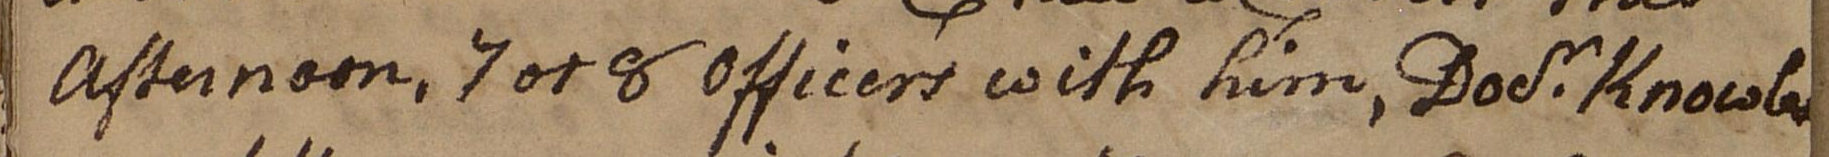Afternoon, 7 or 8 Officers with him, Doc^r. Knowle
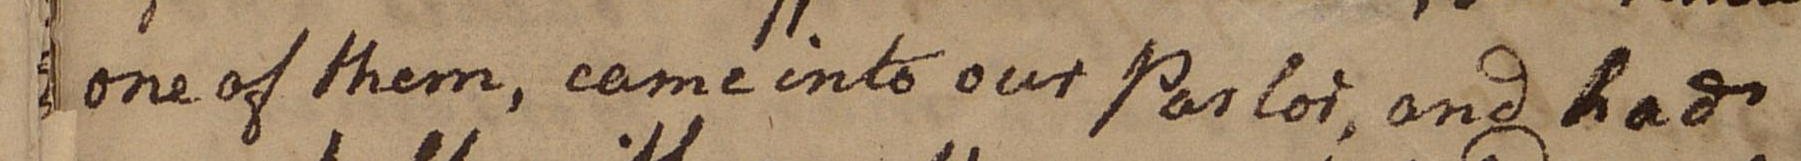one of them, came into our Parlor, and had
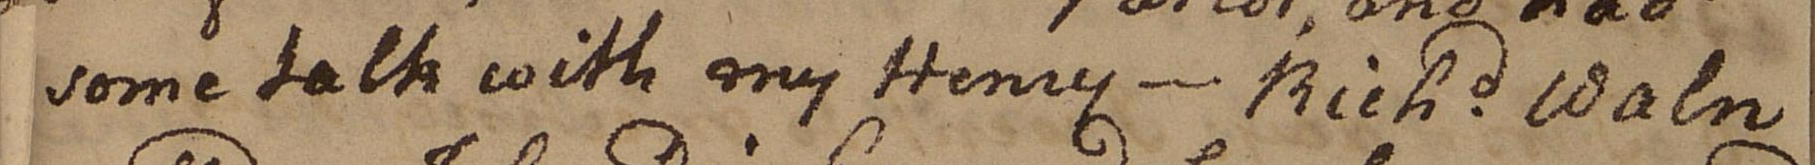some talk with my Henry- Rich^d. Waln
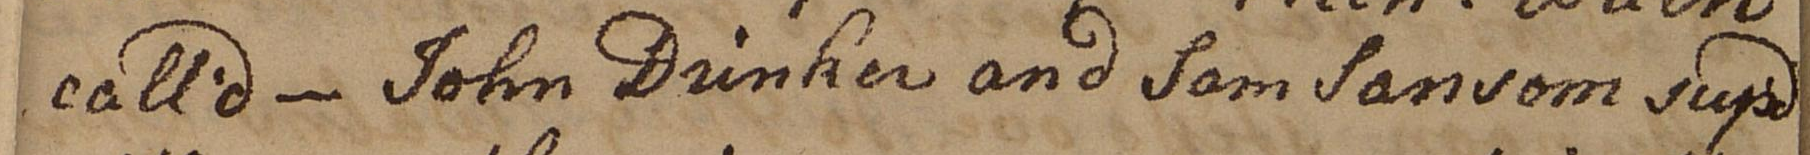call'd- John Drinker and Sam Sansom sup'd
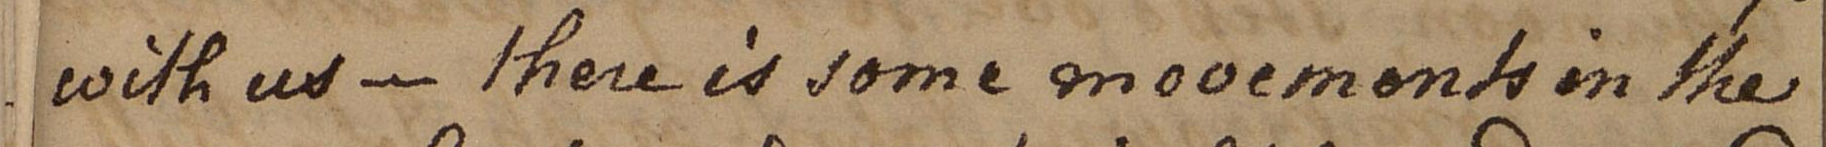with us- there is some movements in the
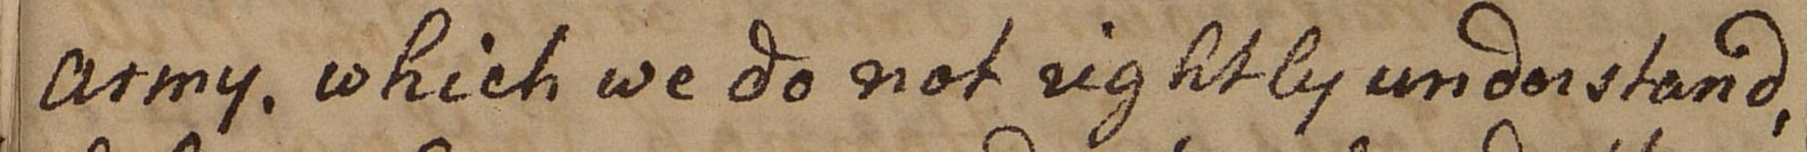Army, which we do not rightly understand,
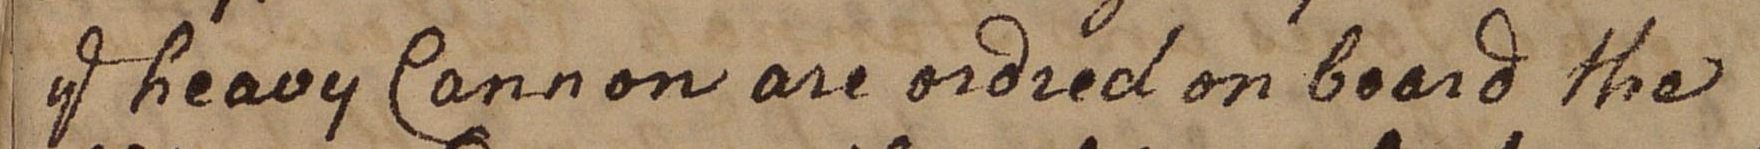y^e heavy Cannon are ordred on board the
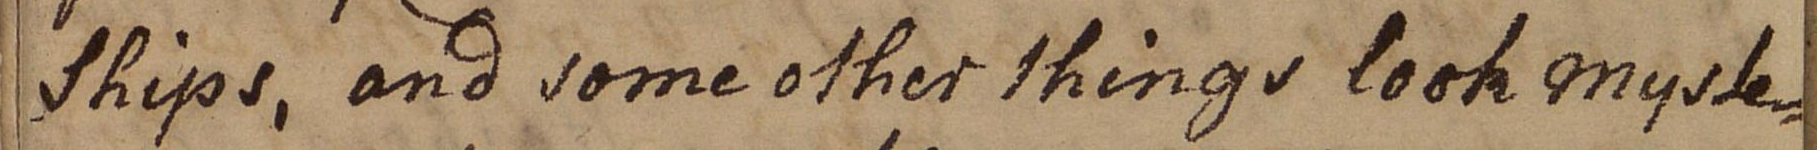Ships, and some other things look myste-
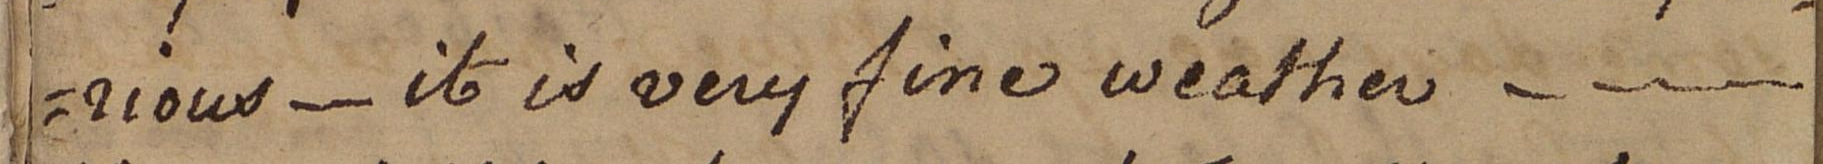-rious- it is very fine weather--
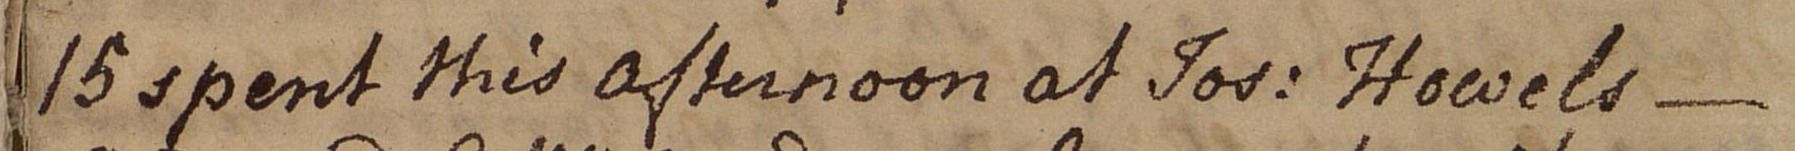15 spent this afternoon at Jos: Howels-
